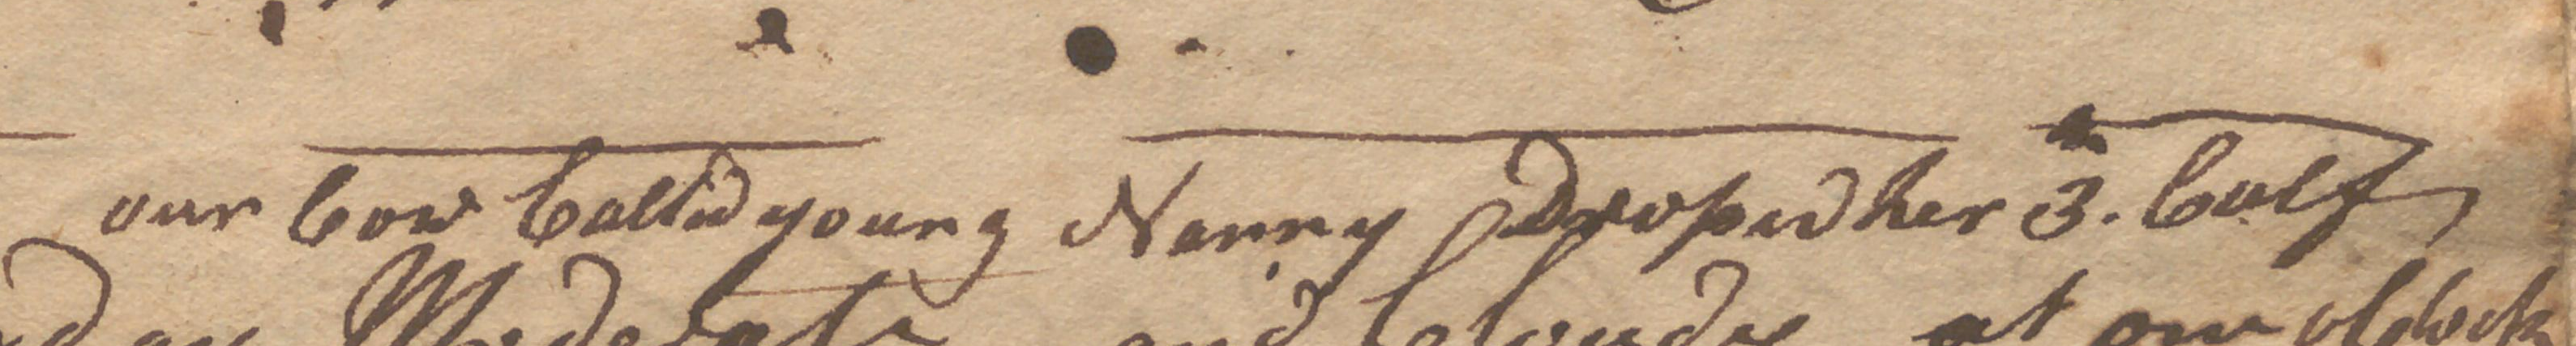sur Cow Calld young Nanny Droped her 3^th. Calf
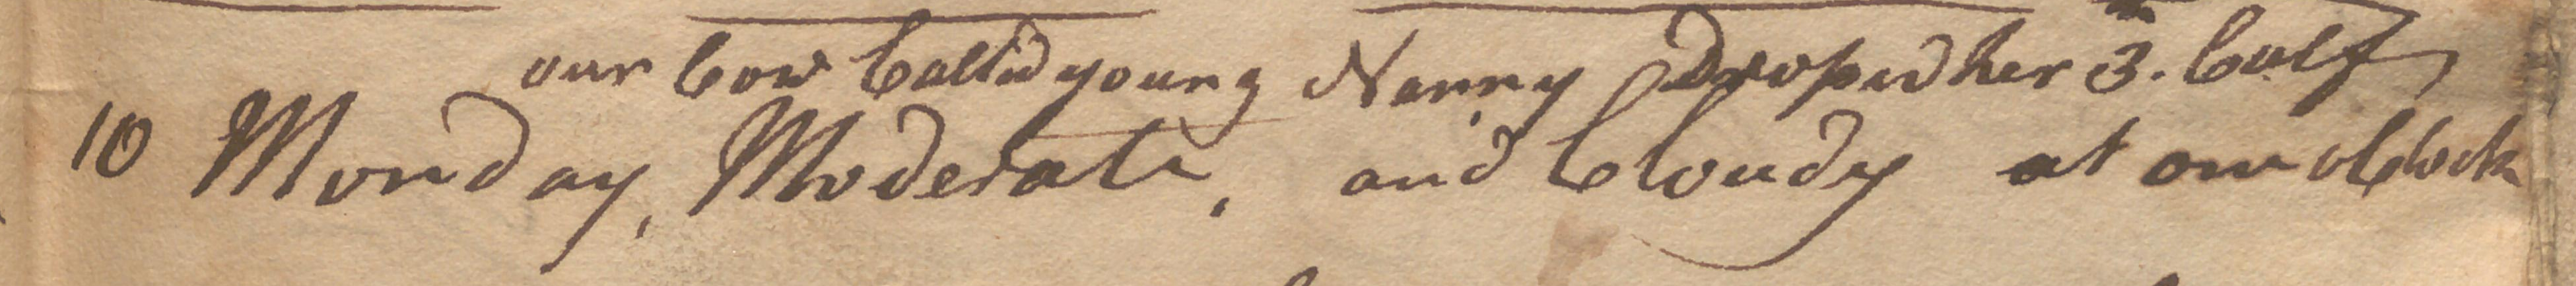10 Monday, Moderate, and Cloudy at one oClock
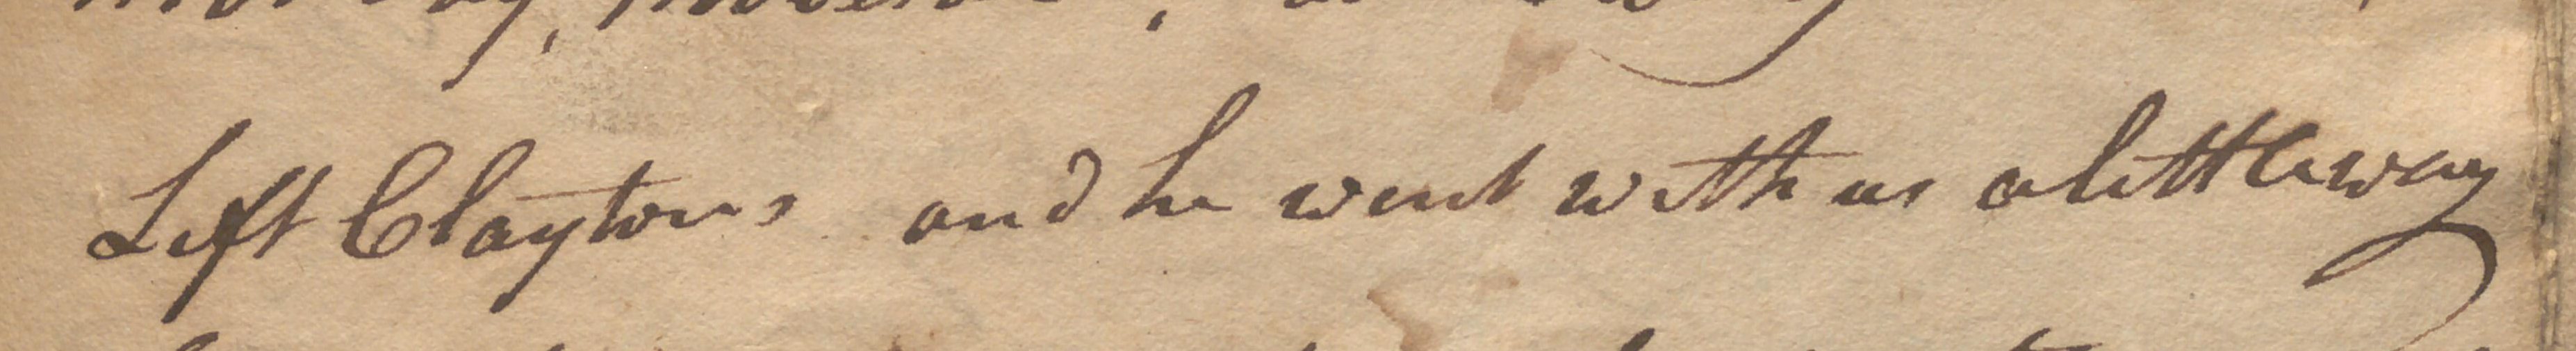Left Claytons and he went with us a little way
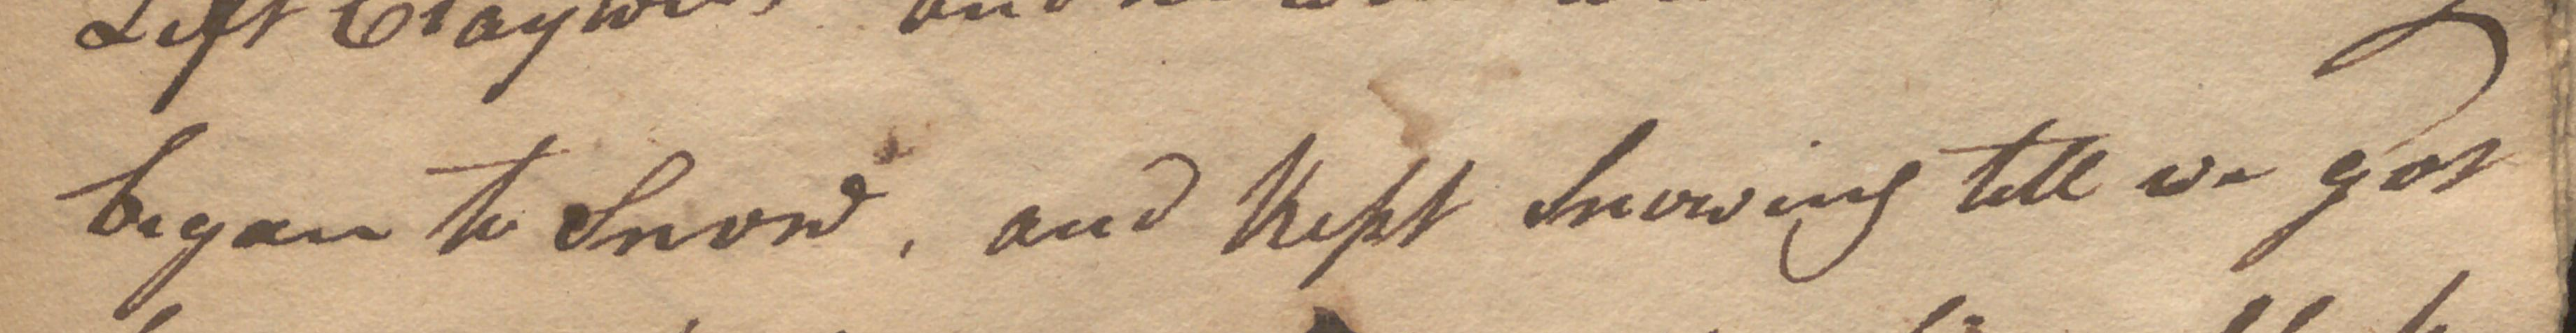began to snow, and kept snowing till we got
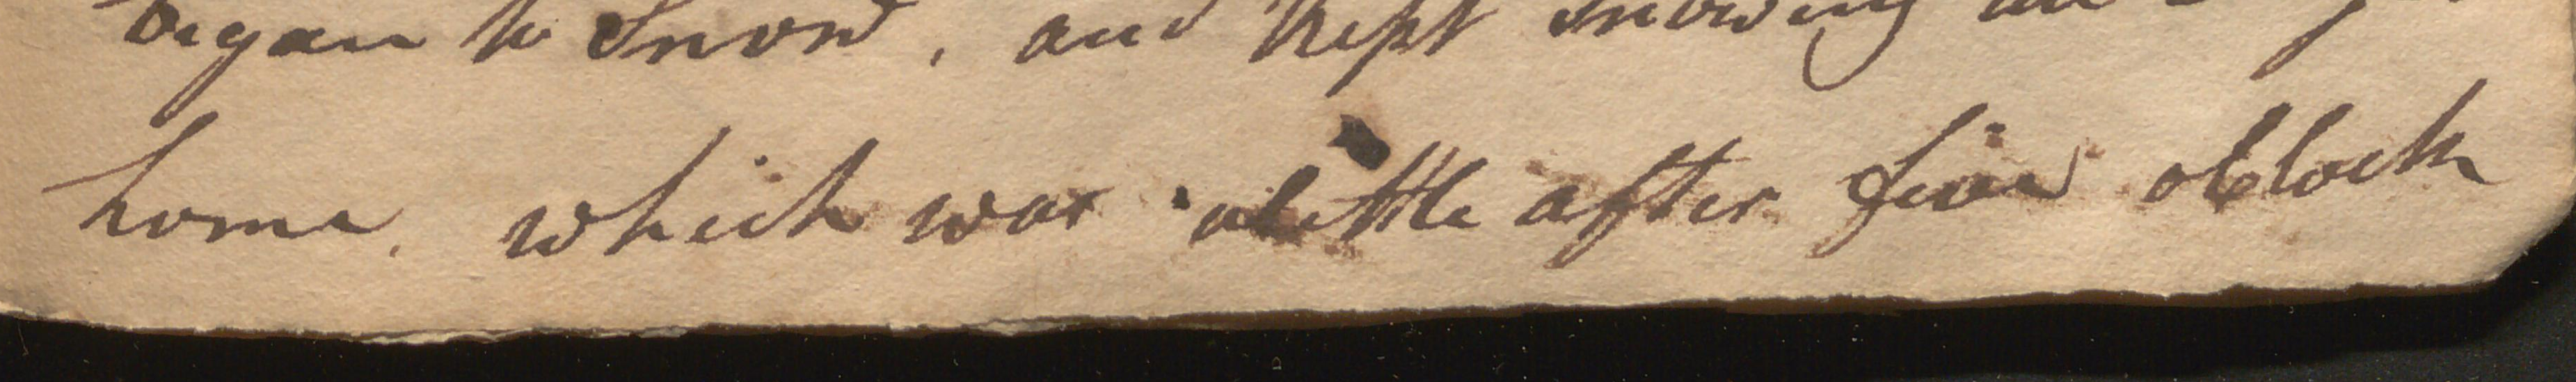home, which was a little after five oClock
